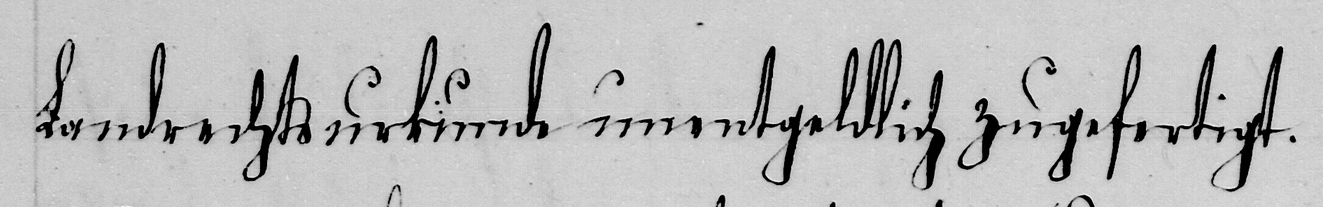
Landrechtsurkunde unentgeldlich zugefertigt.
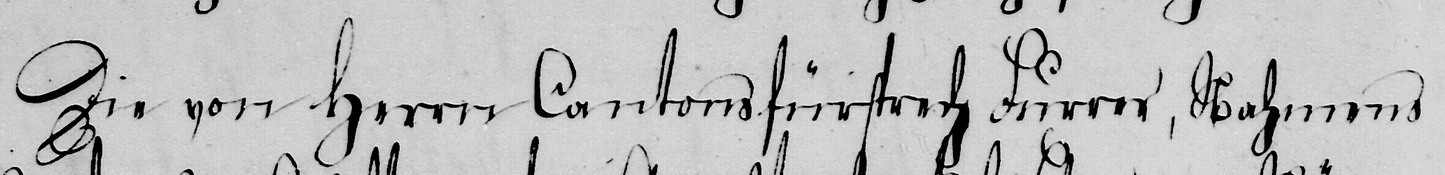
Die von Herrn Cantonsfürsprech Furrer, Nahmens
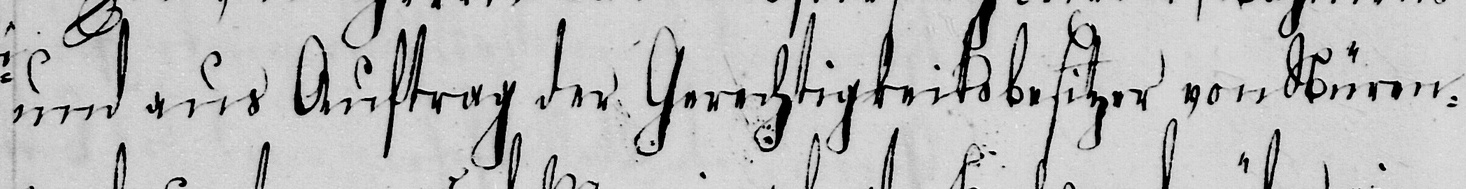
und aus Auftrag der Gerechtigkeitsbesitzer von Nüren¬
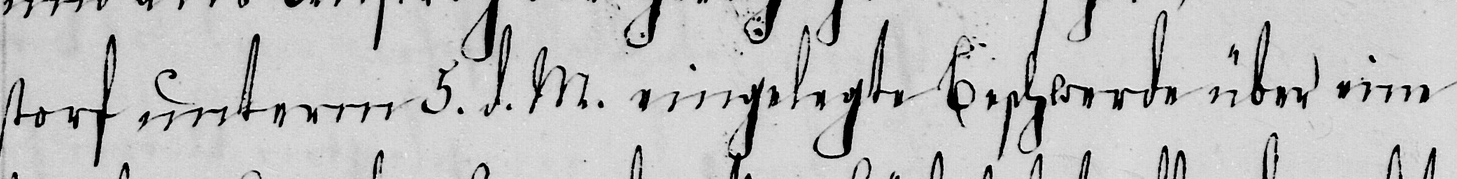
storf unterm 5. d. M. eingelegte Beschwerde über eine
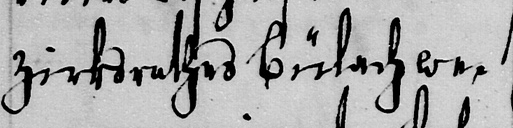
zirksrathes Bülach betr¬
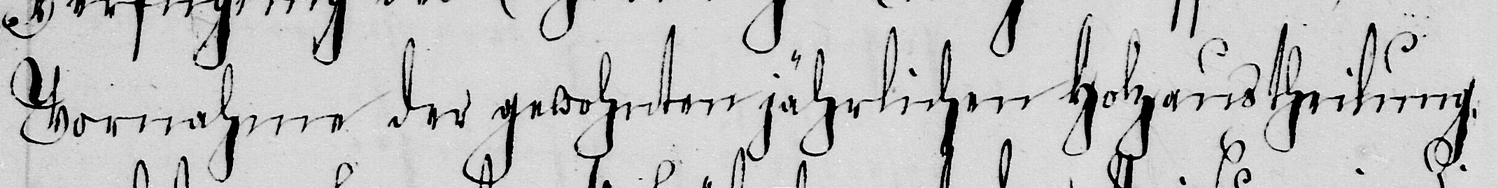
Vornahme der gewohnten jährlichen Holzaustheilung
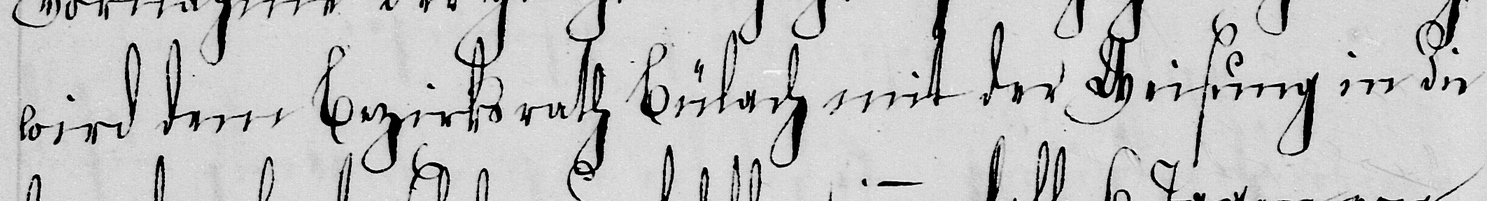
wird dem Bezirksrath Bülach mit der Weisung in die
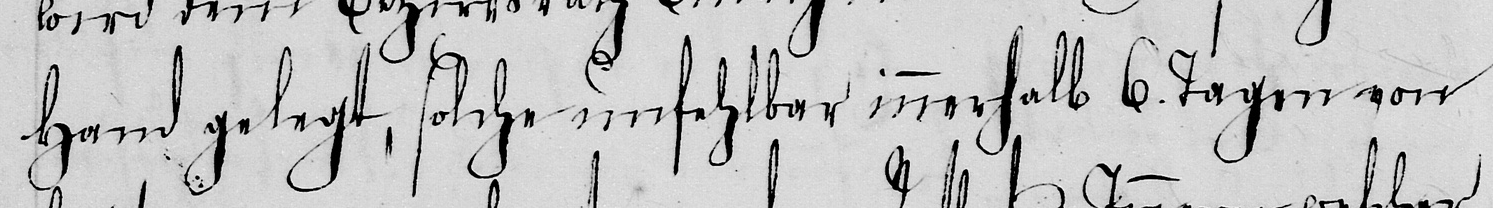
Hand gelegt, solche unfehlbar innerhalb 6. Tagen von
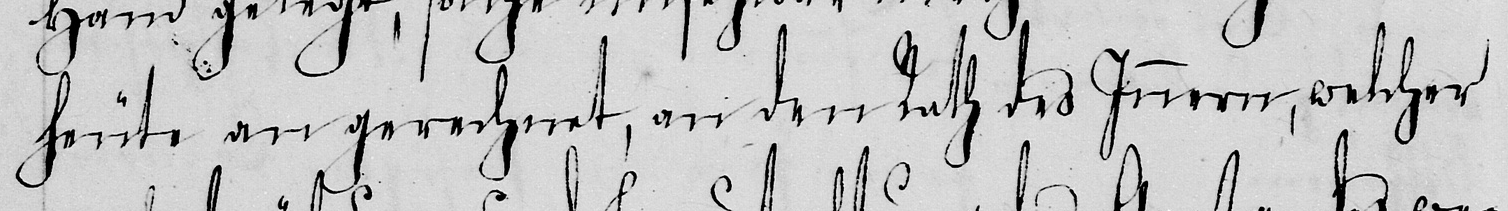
heute an gerechnet, an den Rath des Innern, welcher
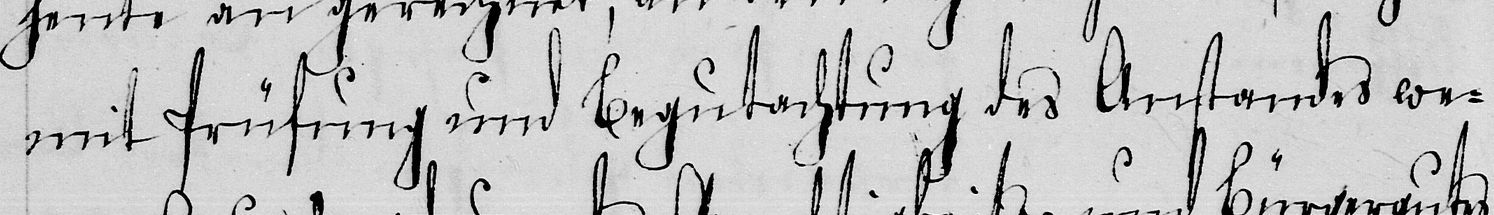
mit Prüfung und Begutachtung des Anstandes we¬
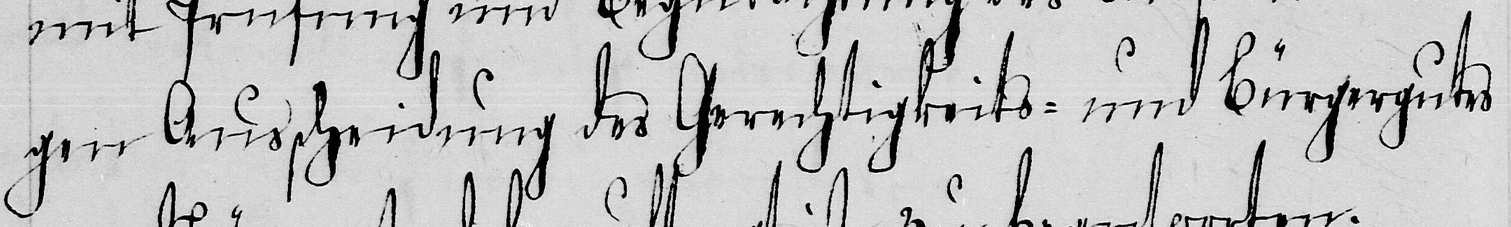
gen Ausscheidung des Gerechtigkeits- und Bürgergutes
